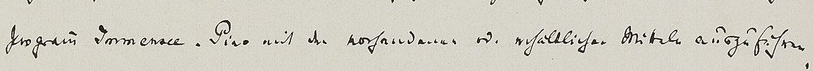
Programm Immensee –Pino mit den vorhandenen od. erhältlichen Mitteln auszuführen,
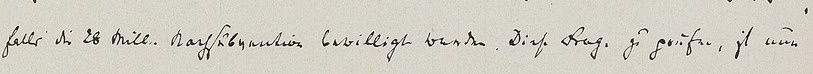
falls die 28. Mill. Nachsubvention bewilligt werden. Diese Frage zu prüfen, ist nun
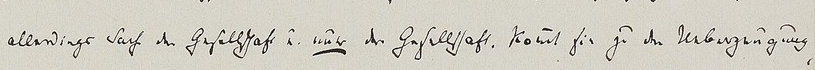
allerdings Sache der Gesellschaft u. nur der Gesellschaft. Kommt sie zu der Ueberzeugung,
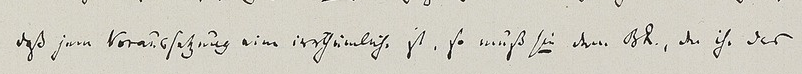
daß jene Voraussetzung eine irrthümliche ist, so muß sie dem BR., der ihr das
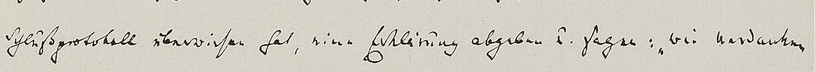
Schlußprotokoll überwiesen hat, eine Erklärung abgeben u. sagen: «wir verdanken
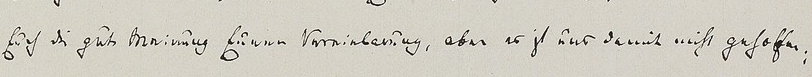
Euch die gute Meinung Eurer Vereinbarung, aber es ist uns damit nicht geholfen;
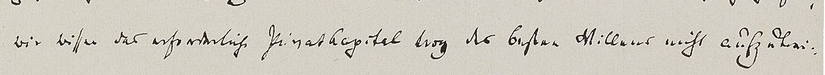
wir wissen das erforderliche Privatkapital troz des besten Willens nicht aufzutrei-
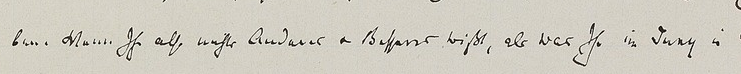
ben. Wenn Ihr also nichts Anderes & Besseres wißt, als was Ihr im Juny in
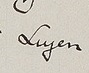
Luzern
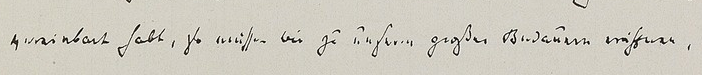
vereinbart habt, so müssen wir zu unserm großen Bedauern eröffnen,
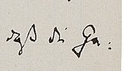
daß die Ge-
